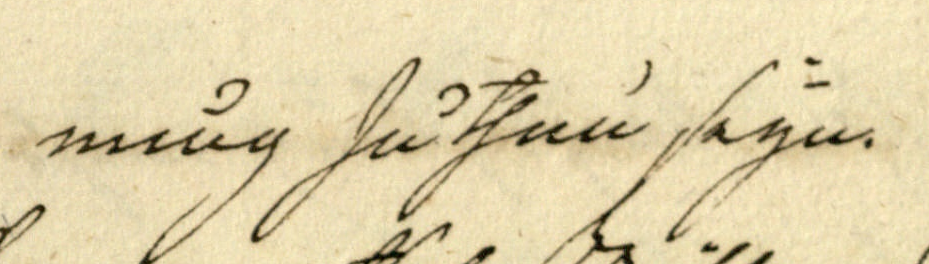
nung zu thun seÿn.
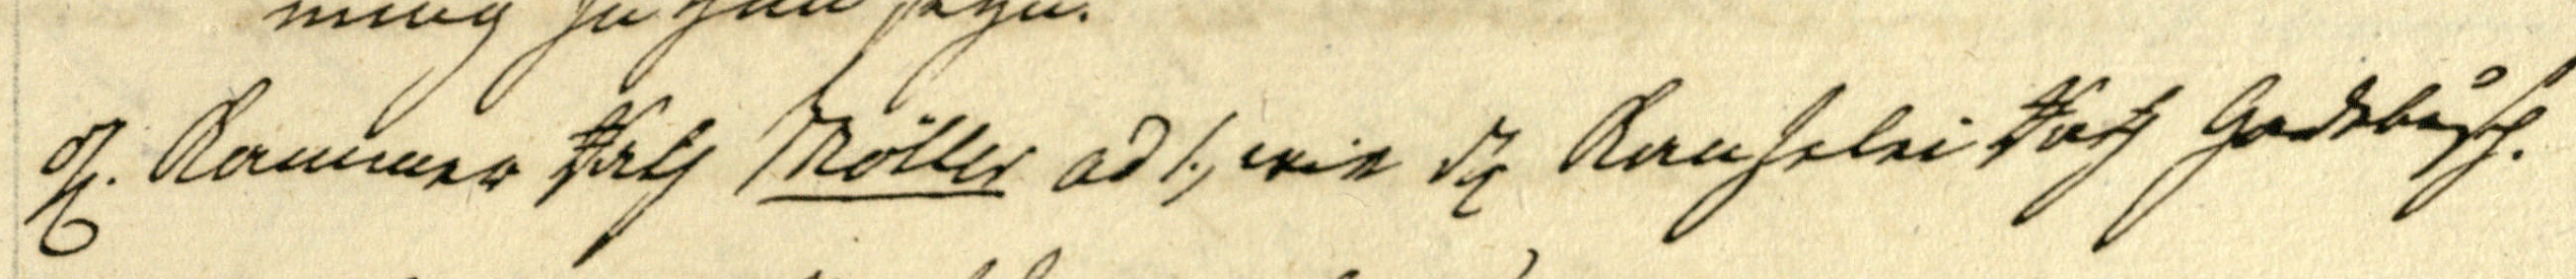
dh. Kammer Rath Möller ad 1., wie dh. Kanzelei Rath Gadebusch.
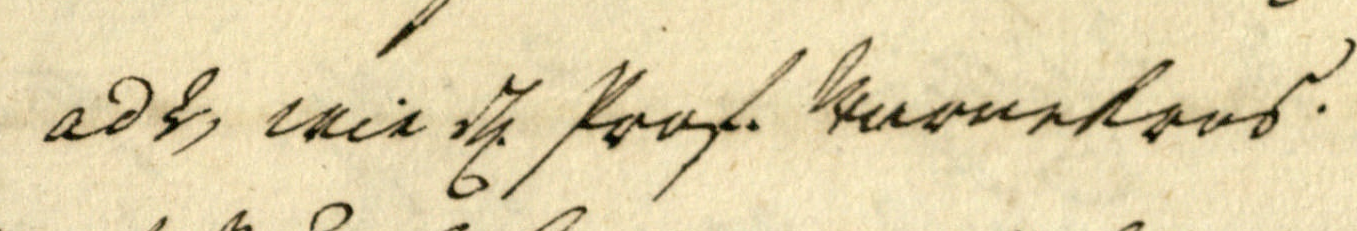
ad 2., wie dh. Prof. Warnekros.
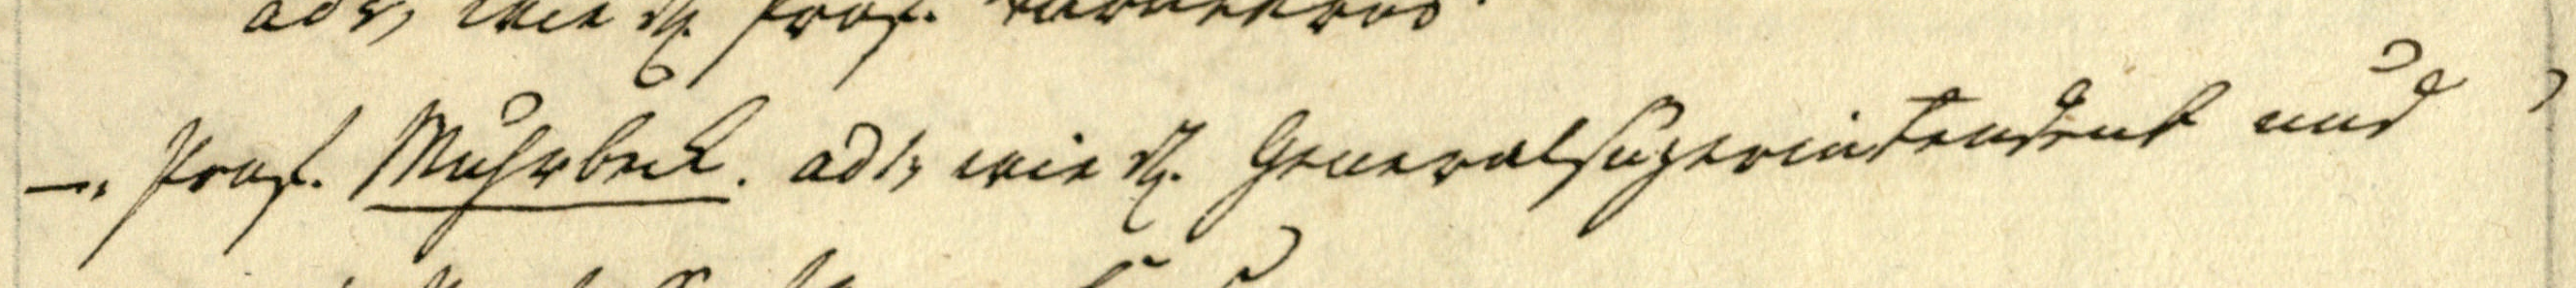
— . Prof. Muhrbeck. ad 1, wie dh. Generalsuperintendent und
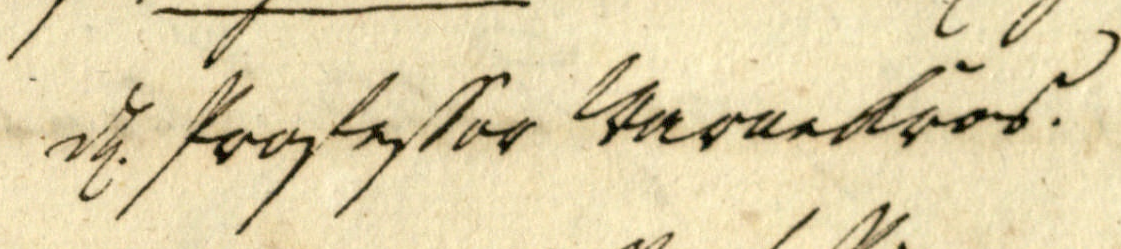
dh. Professor Warnekros.
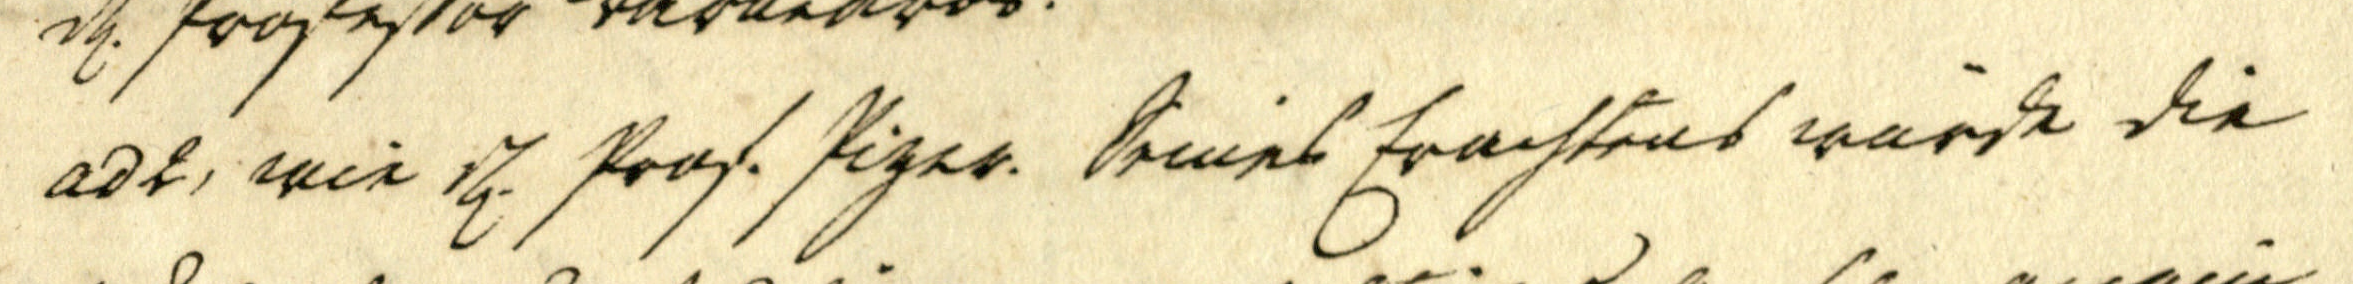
ad 2, wie dh. Prof. Piper. Seines Erachtens würde die
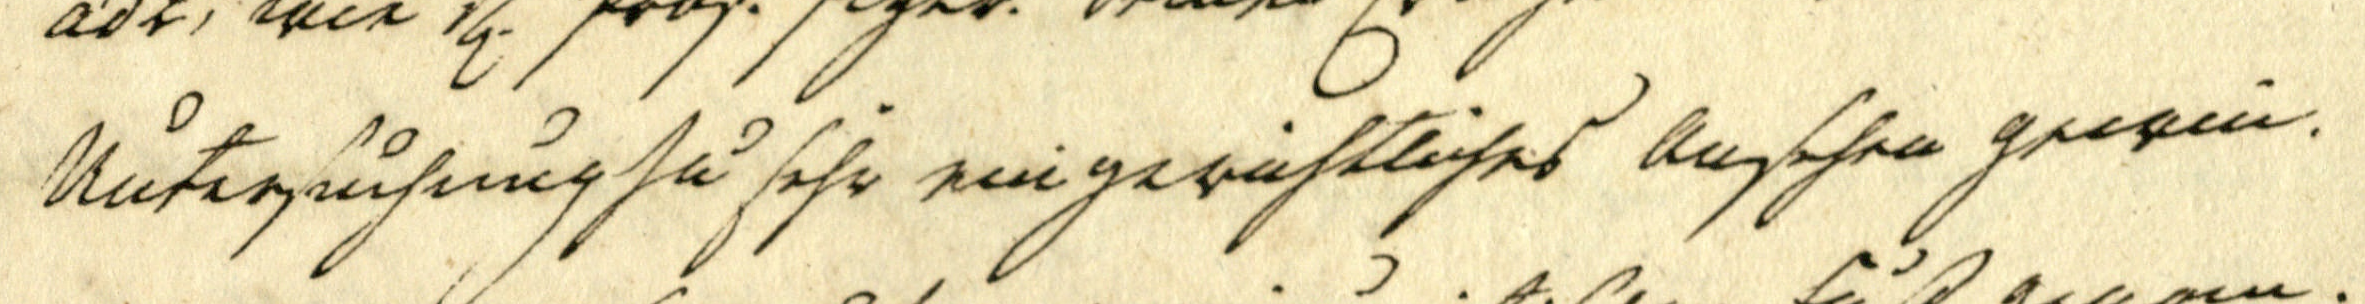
Untersuchung zu sehr ein gewichtliches Ansehen gewin¬
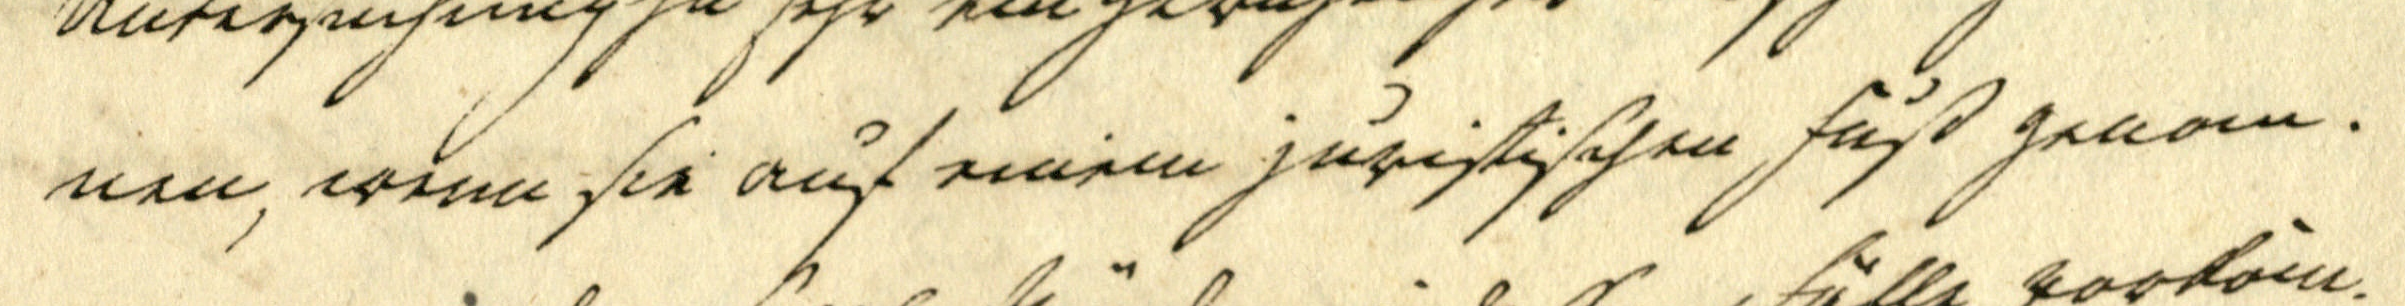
nen, wenn sie auf einem juristischen Fuß genom-
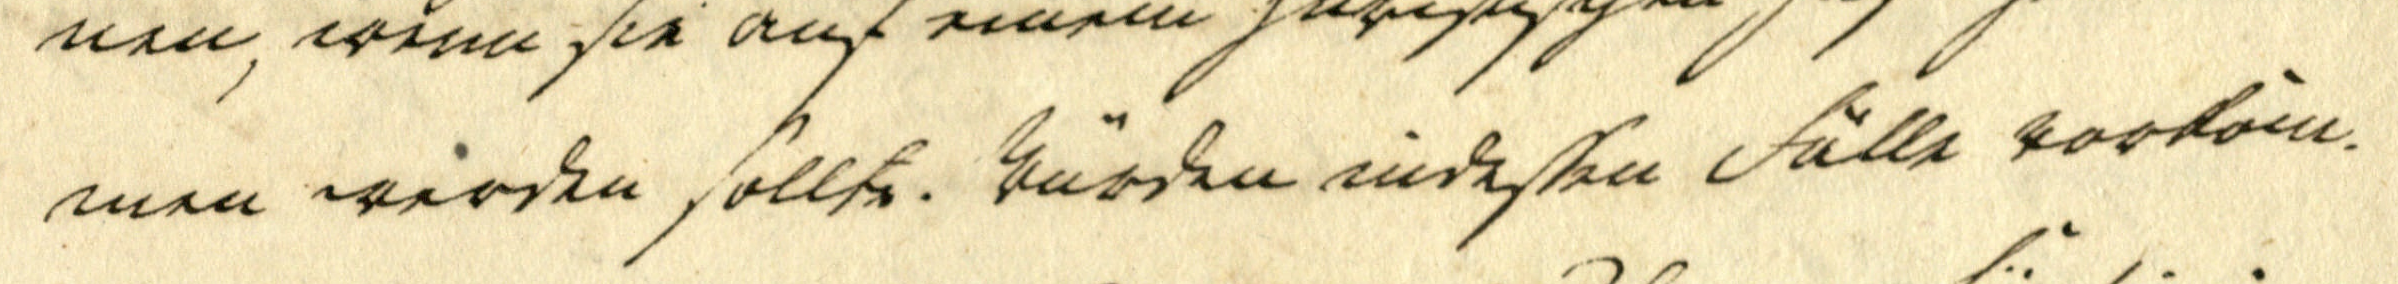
nen werden sollte. Würden indessen Fälle vorkom
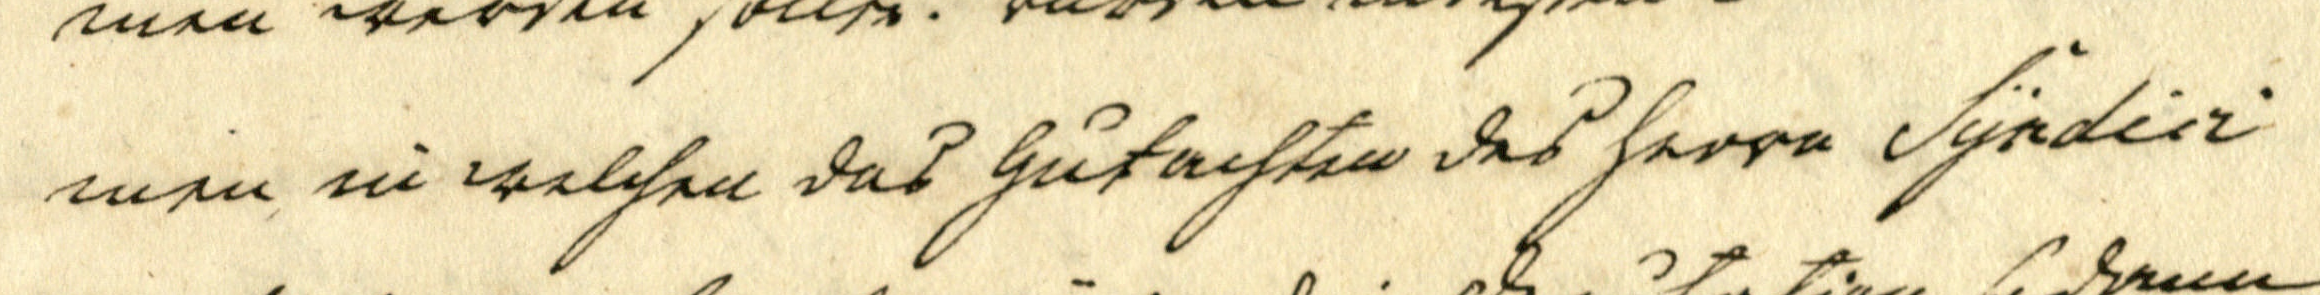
men in welchen das Gutachten des Herrn Sÿndici
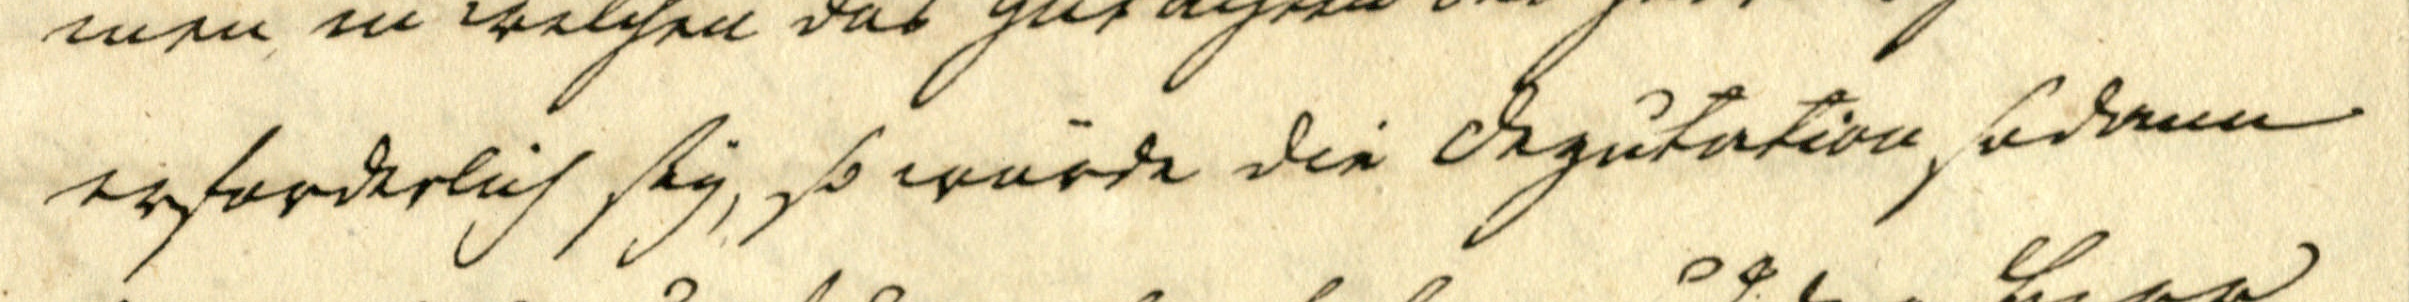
erforderlich seÿ, so würde die Deputation sodann
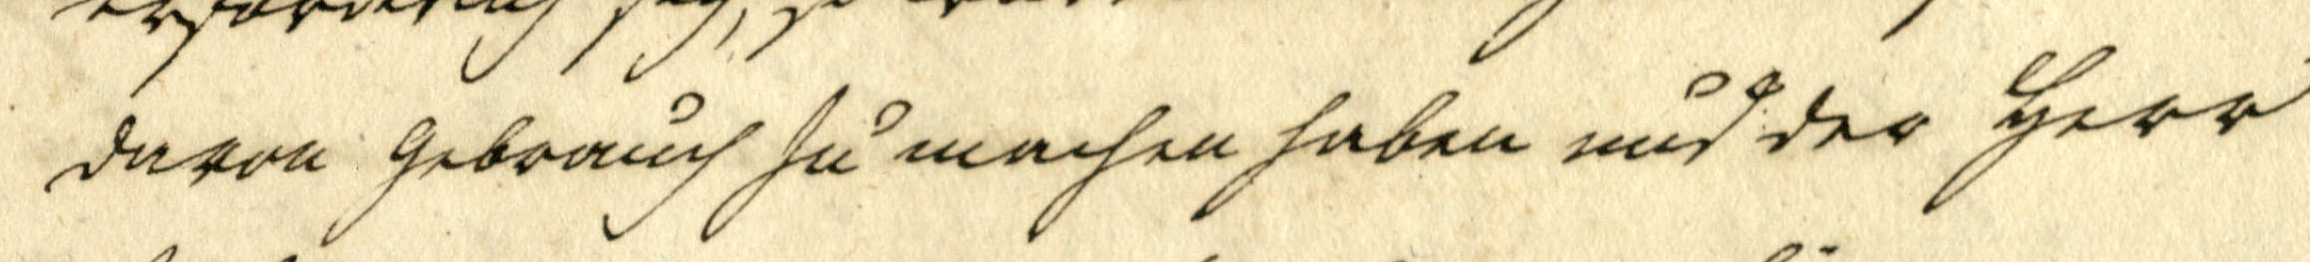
davon Gebrauch zu machen haben und der Herr
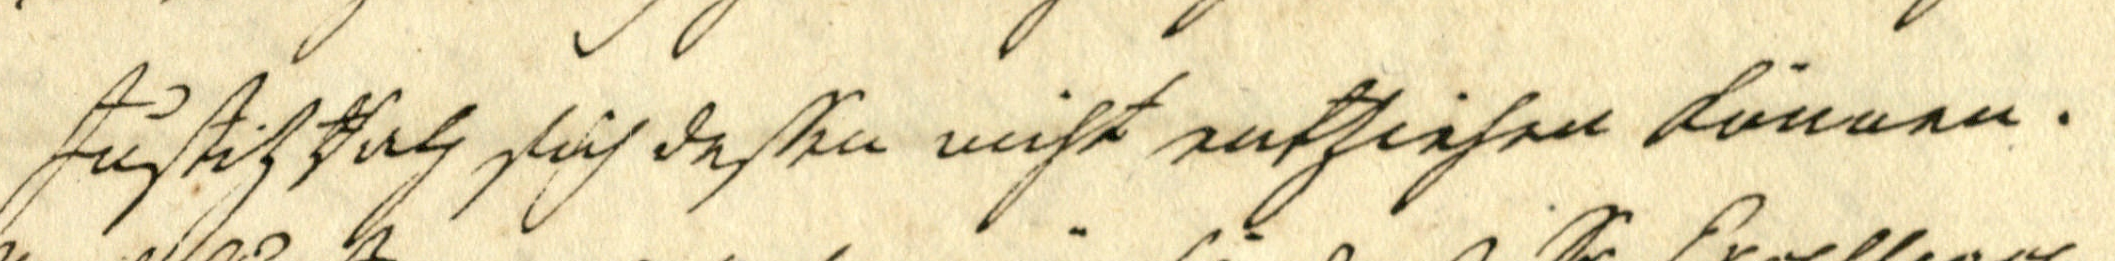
Justiz Rath sich dessen nicht entziehen können.
